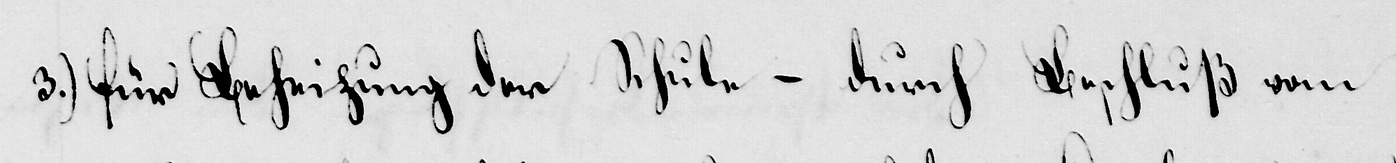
3.) für Beheizung der Schule – durch Beschluß vom
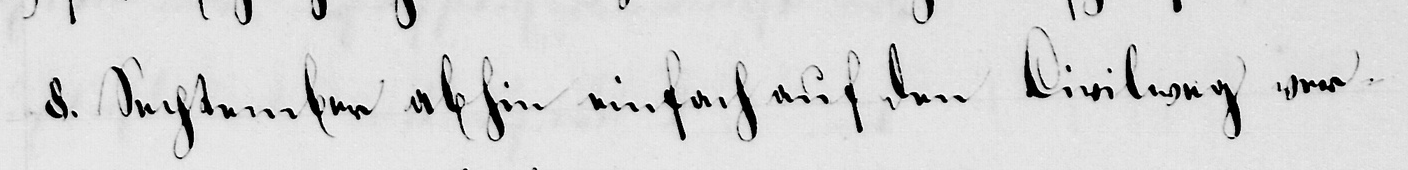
8. September abhin einfach auf den Civilweg ver¬
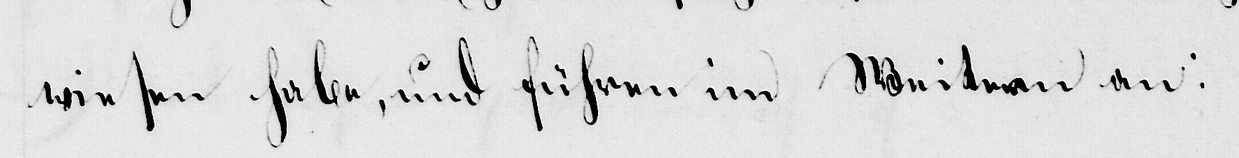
wiesen habe, und führen im Weitern an:
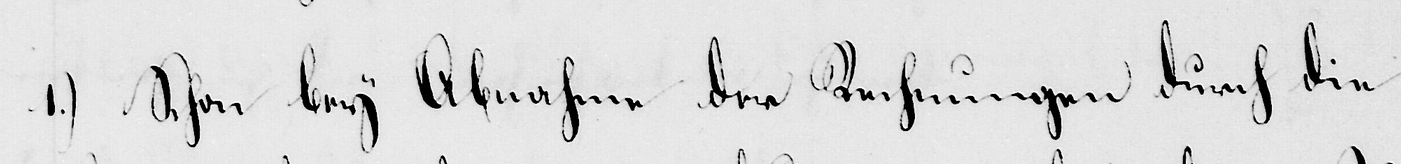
1.) Schon bey Abnahme der Rechnungen durch die
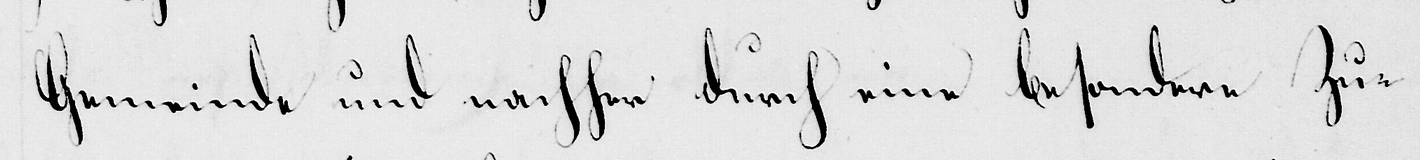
Gemeinde und nachher durch eine besondere Zu¬
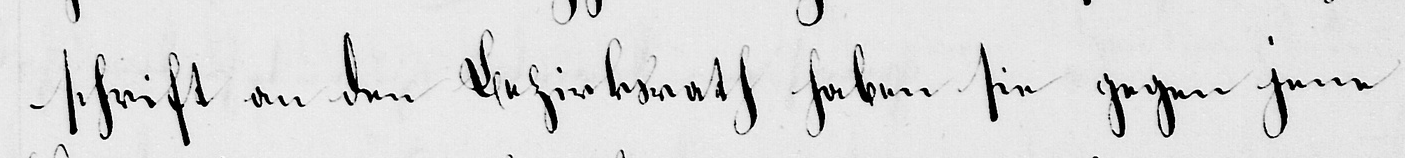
schrift an den Bezirksrath haben sie gegen jene
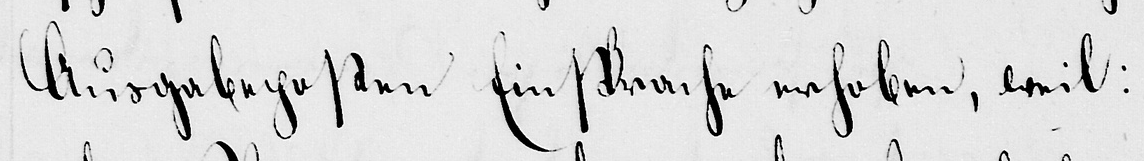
Ausgabeposten Einsprache erhoben, weil:
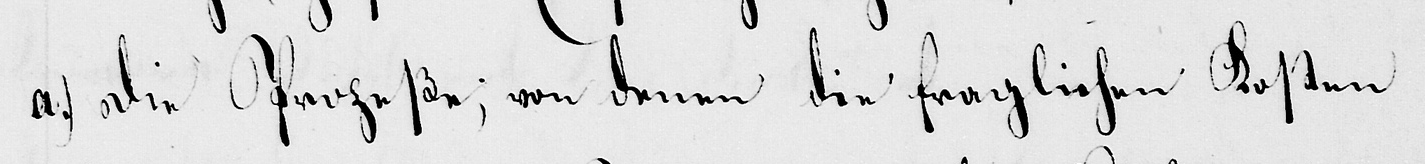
a.) die Prozeße; von denen die fraglichen Kosten
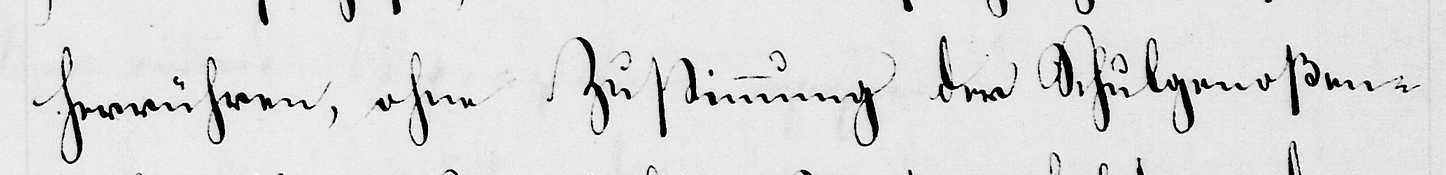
herrühren, ohne Zustimmung der Schulgenoßen¬
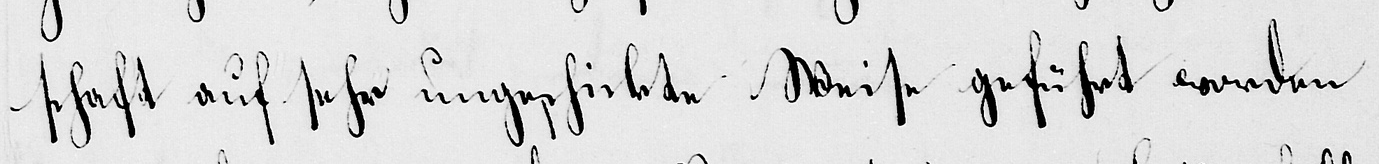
schaft auf sehr ungeschickte Weise geführt worden
